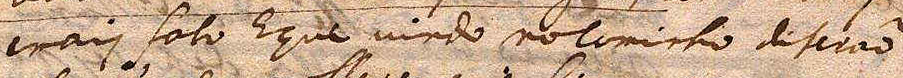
e mais fato E que uindo no caminho diseraõ
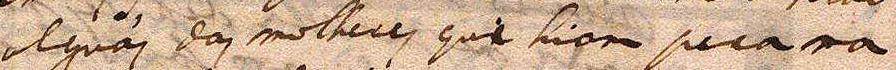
alguās das molheres que hiam pera ma
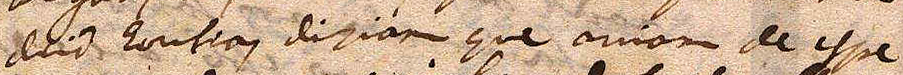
drid E outras diziam que auiam de espe
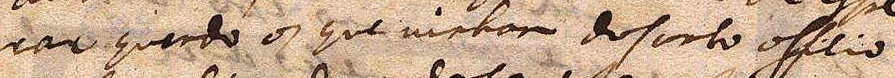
rar quando os que uinham do santo officio
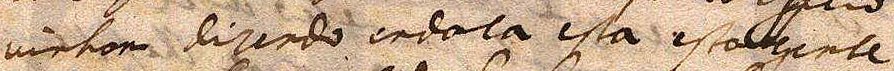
uinham dizendo erdara esta esta gente
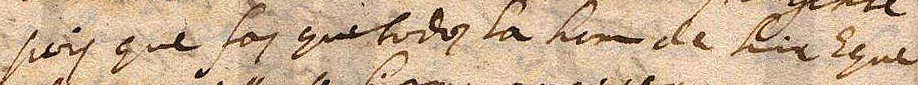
pois que fas que todos la ham de hir E que
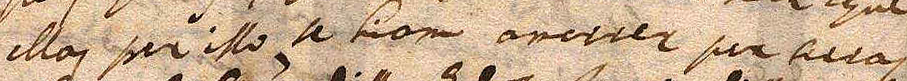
ellas per isso se hiam a morrer per terras
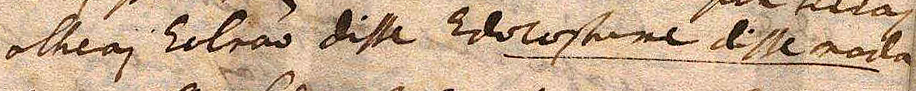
alheas E al naõ disse E do costume disse nada
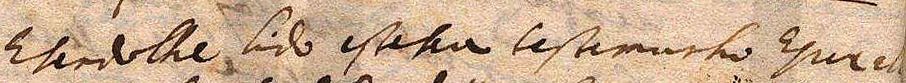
E sendolhe lido este seu testemunho E por el
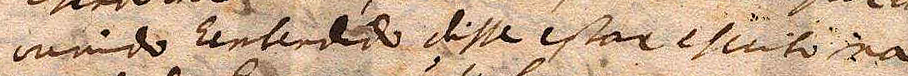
ouuido E entendido disse estar escrito na
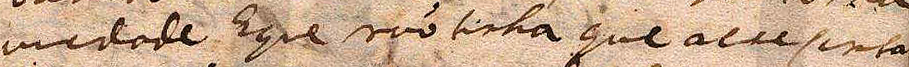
uerdade E que naõ tinha que acresenta
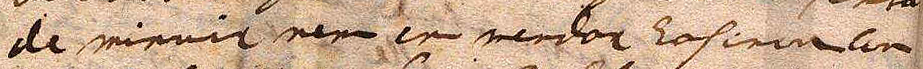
deminuir nem emmendar E asinou com
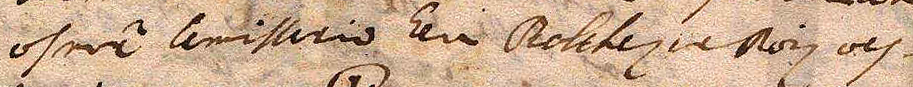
o snor̄ Comissario E eu Balthezar Roiz o es
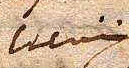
creuii
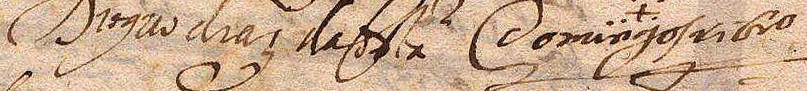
Dioguo dias da Costa Domingos ribro
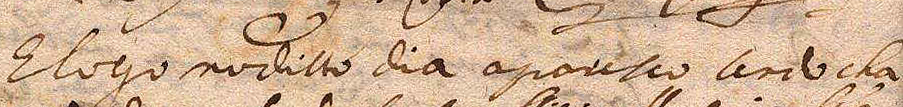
E logo no ditto dia apareseo sendo cha
